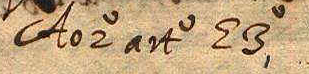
Ao 2o arto E 3o
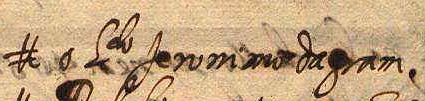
# o L.do Jeromimo da gram
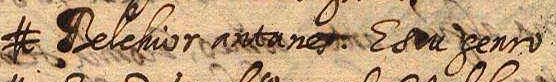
# Belchior antunes. E seu genro
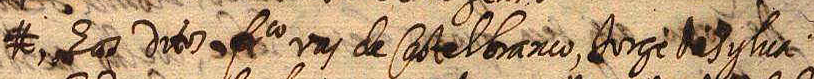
# E os ditos fr.co vas de Castel branco, Iorge da Sylua
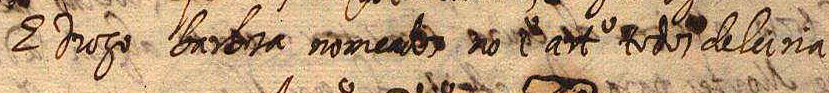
E diogo barboza nomeados no 1o arto todos de leiria
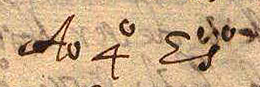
Ao 4o E 5o
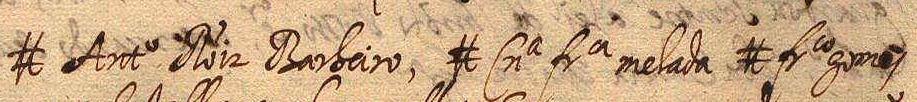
# Anto Rōiz Barbeiro, # Cna frca melada # frco gomes
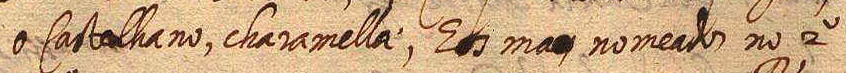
o Castelhano, charamella; E os ma_s nomeados no 2o
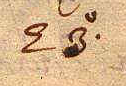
E 3o.
